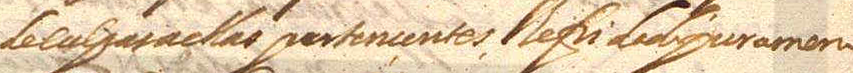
de culpas a ellas pertençentes, lhe foi dado juramen
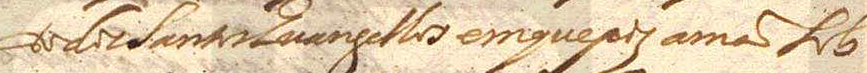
to dos Santos Euangelhos em que poz a maõ sob
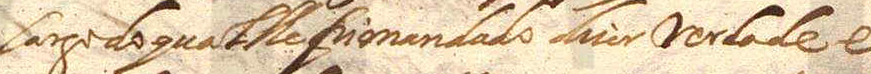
Cargo do quaL lhe foi mandado diser verdade, e
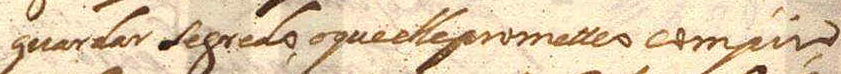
guardar segredo, o que elle prometteo comprir,
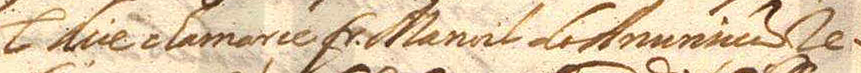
E diçe chamarçe fr. Manoel da Anunsição Re
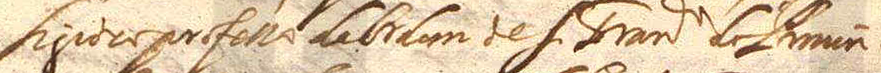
ligiozo professo da Ordem de S. Franco da Prouin
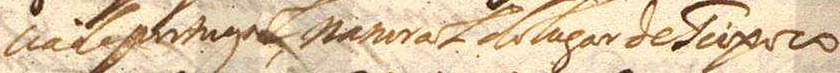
cia de portugaL, naturaL do lugar de Teixozo
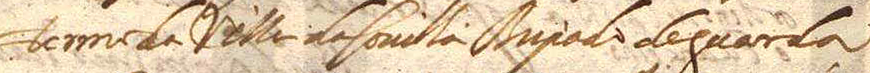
termo da Villa da Couilha Bispado da guarda
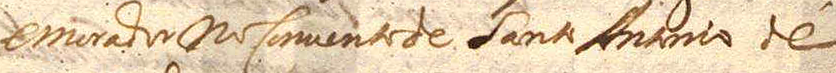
e morador no Conuento de Santo Antonio de
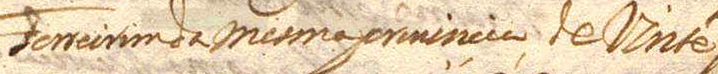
Ferreirim da mesma prouinçia, de vinte
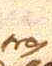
tres
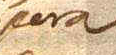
pera
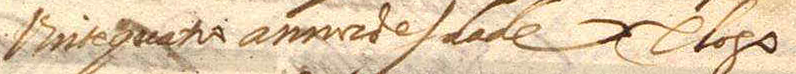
vinte quatro annos de jdade E logo
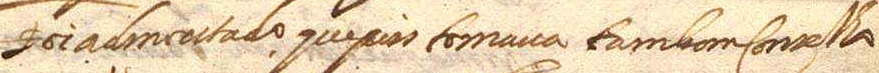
foi admoestado que pois tomaua tam bom Conselho
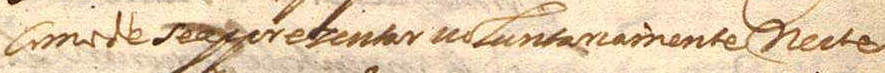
como de se apprezentar uoluntariamente nesta
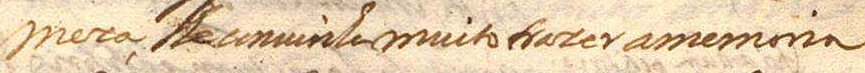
meza, lhe conuinha muito trazer a memoria
